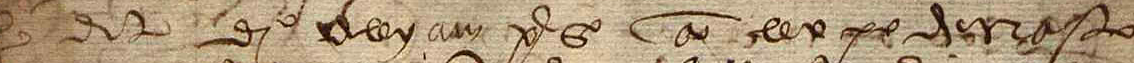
ho dito djo de llyam p̄so c̄o elle po de crasto
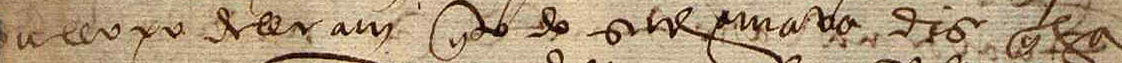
u llopo de lleam q̄ todo se chamava dise q̄ ha
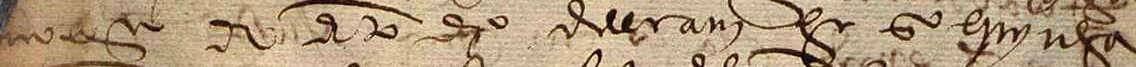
molher do dito djo de lleam he sobrynha
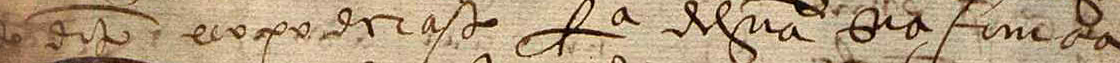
do dito llopo de crasto fa de hūa sua Jrmaa
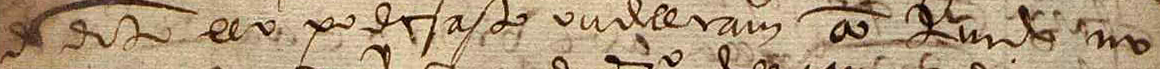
do dito llopo de crasto ou de lleam c̄oteudo no
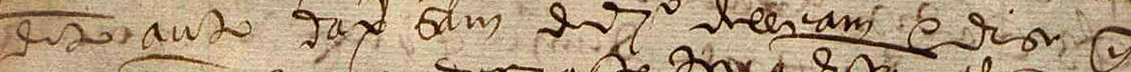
dito auto da p̄sam de djo de lleam e dise q̄
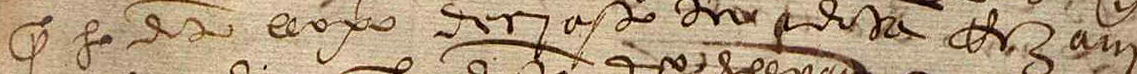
p̄o ho dito llopo de crasto ter a dita Rezam
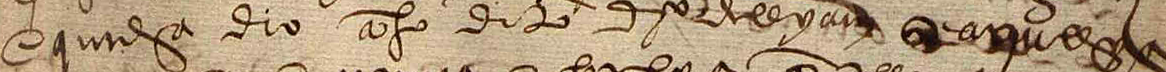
e qunhadio c̄o ho dito djo de llyam se aqulhya
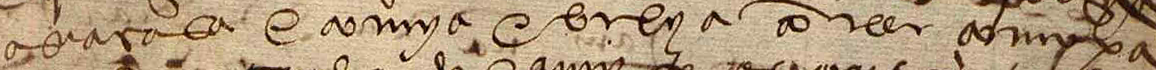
a sua casa e comya e bebya c̄o elle como pa
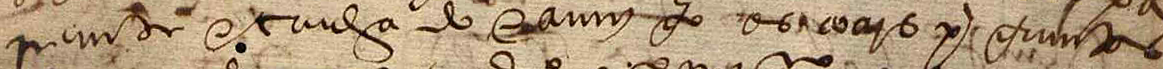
remte e cunhado e amygo as coajs p̄gumtas
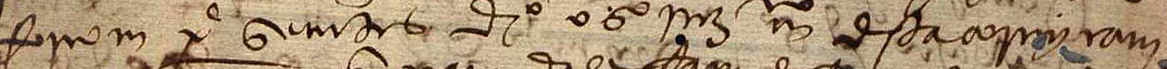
forom p̄semtes djo osorrez mro desta comyçam
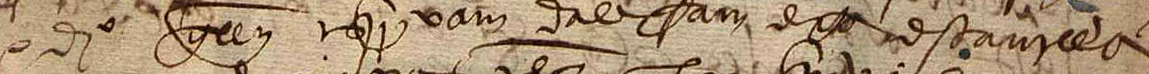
e djo ḡllz esp̄vam dallfamdega desta ujlla
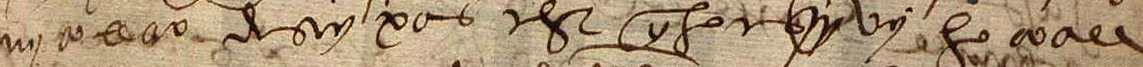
nycollao de seyxas c̄hr q̄ ho esp̄vy ho coall
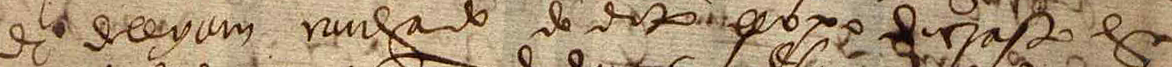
djo de llyam cunhado do dito llopo de crasto he
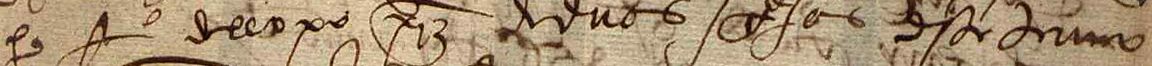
ho fo de llopo p̄iz de duas JḡJas deste termo
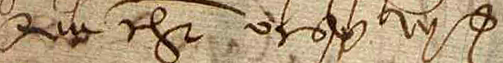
e eu c̄hr o esp̄vy
